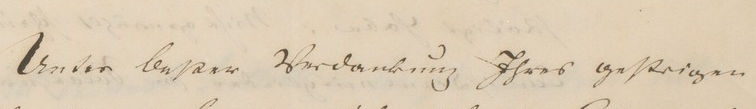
Unter bester Verdankung Ihres gestrigen
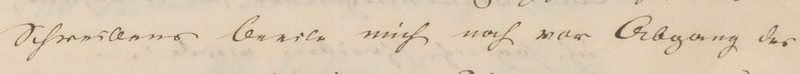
Schreibens beeile mich noch vor Abgang des
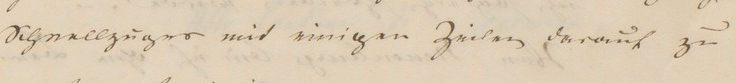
Schnellzuges mit einigen Zeilen darauf zu
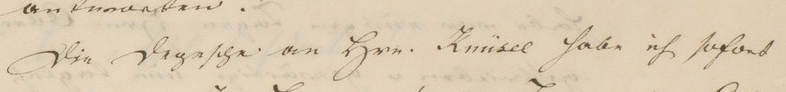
Die Depesche an Hrn. Knüsel habe ich sofort
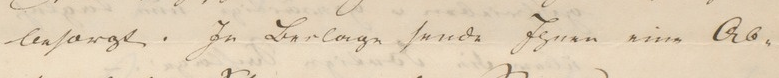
besorgt. In Beilage sende Ihnen eine Ab-
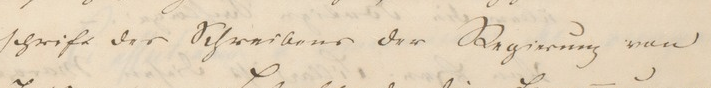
schrift des Schreibens der Regierung von
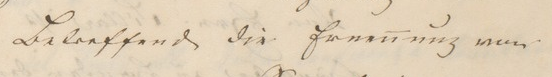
– Betreffend die Ernennung von
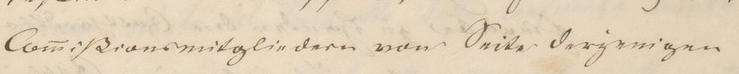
Commißionsmitgliedern von Seite derjenigen
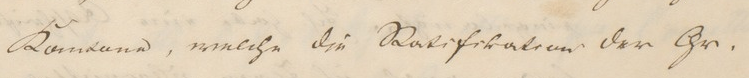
Kantone, welche die Ratifikation der Gr.
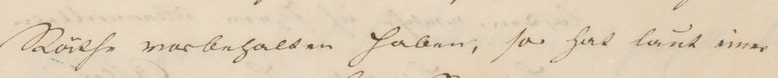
Räthe vorbehalten haben, so hat laut einer
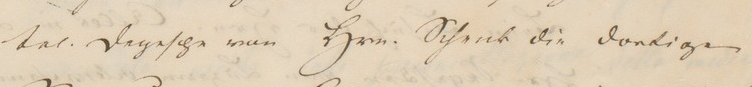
tel. Depesche von Hrn. Schenk die dortige
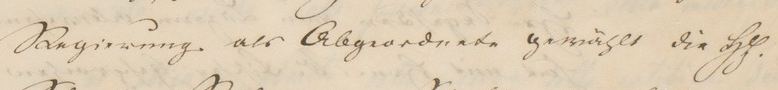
Regierung als Abgeordnete gewählt die Hh.
